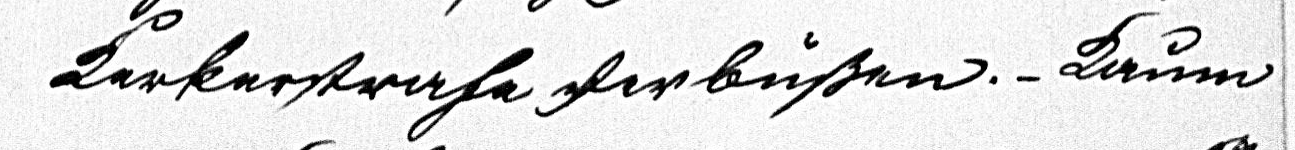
Kerkerstrafe verbüßen. - Kaum
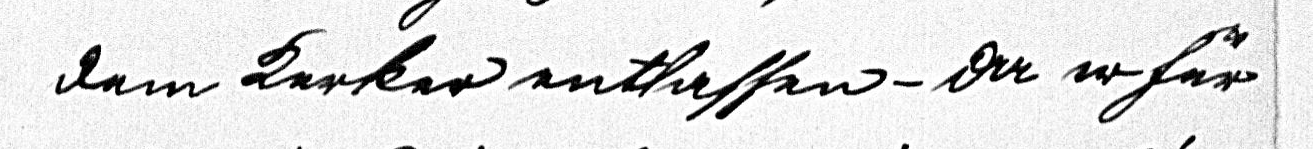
dem Kerker entlassen - da er für
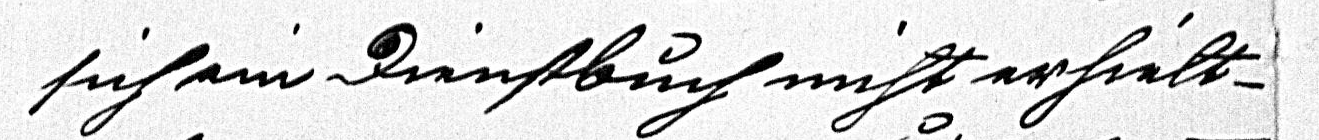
sich ein Dienstbuch nicht er hielt¬
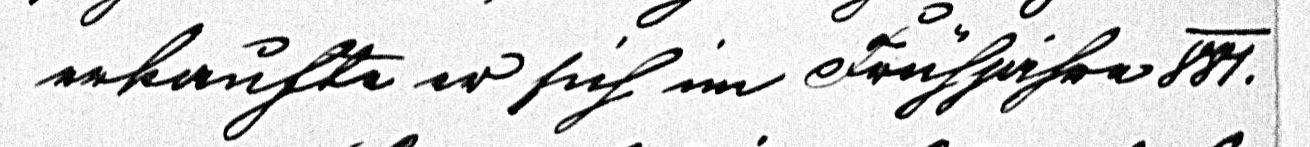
erkaufte er sich im Frühjahre 881.
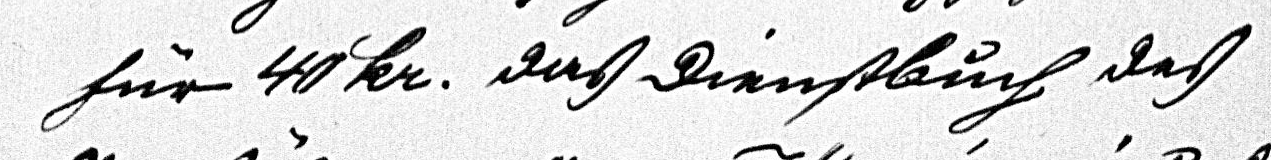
für 40 kr. Das Dienstbuch des
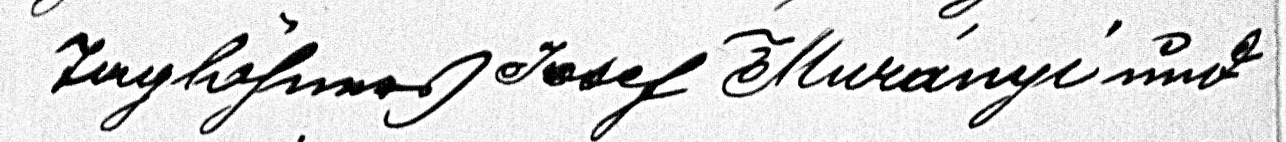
Taglöhners Josef Murányi und
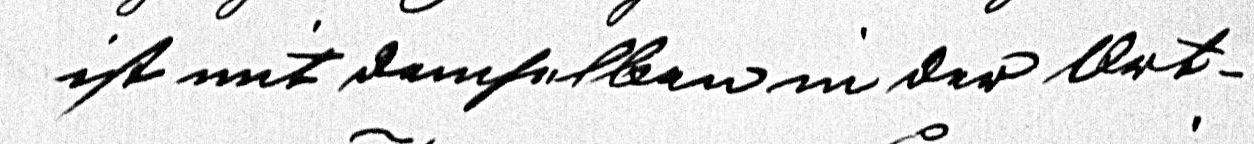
ist mit demselben in der Ort¬
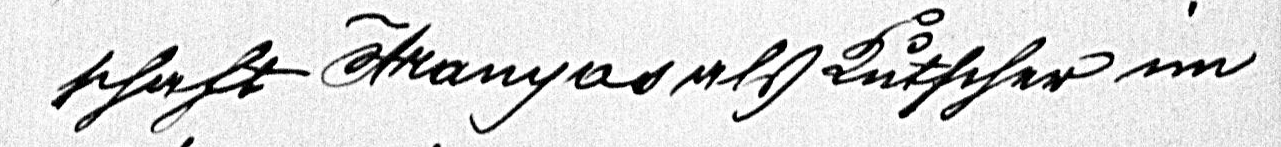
schaft Manyas als Kutscher im
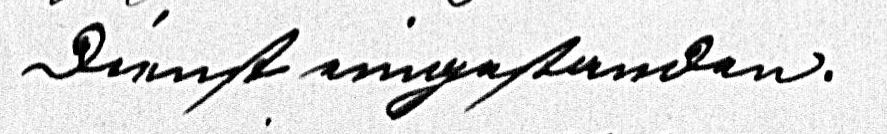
Dienst eingestanden.
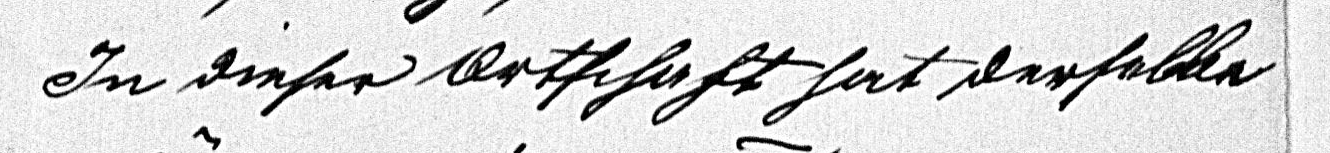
In dieser Ortschaft hat derselbe
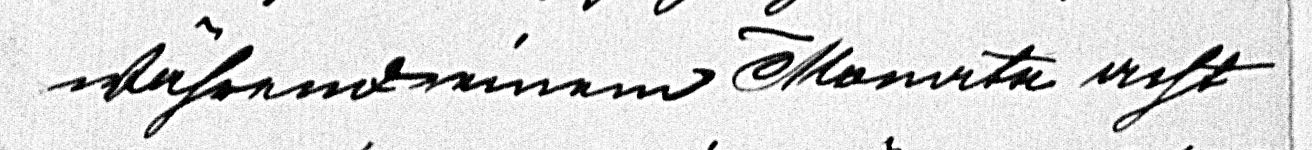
während einem Monate acht
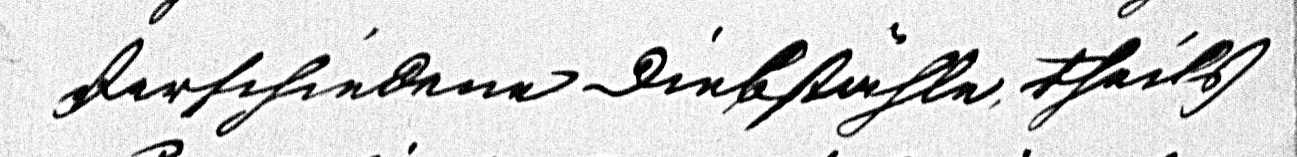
Verschiedene Diebstähle, theils
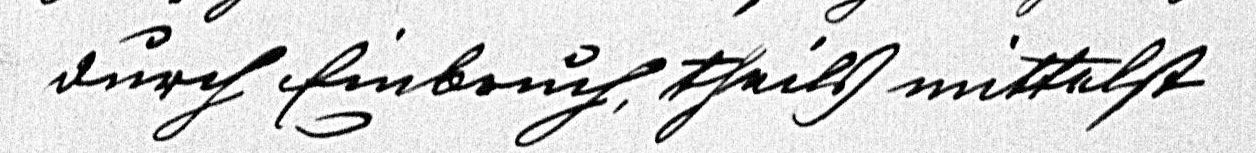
durch Einbruch, theils mittelst
